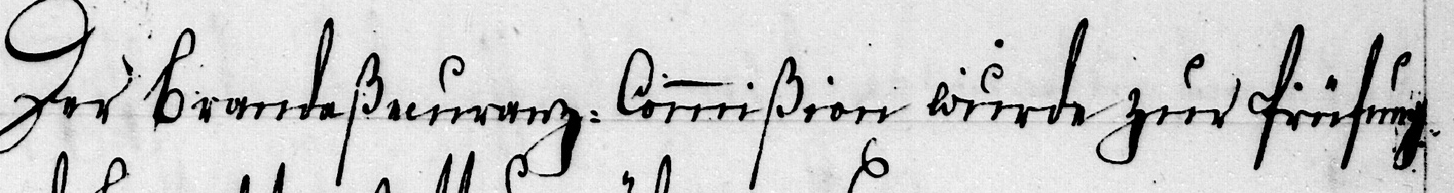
Der Brandaßecuranz-Commißion wurde zur Prüfung
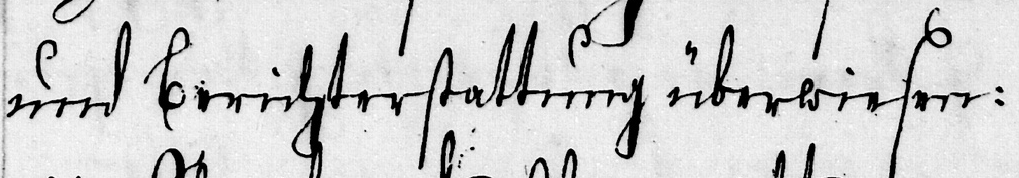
und Berichterstattung überwiesen:
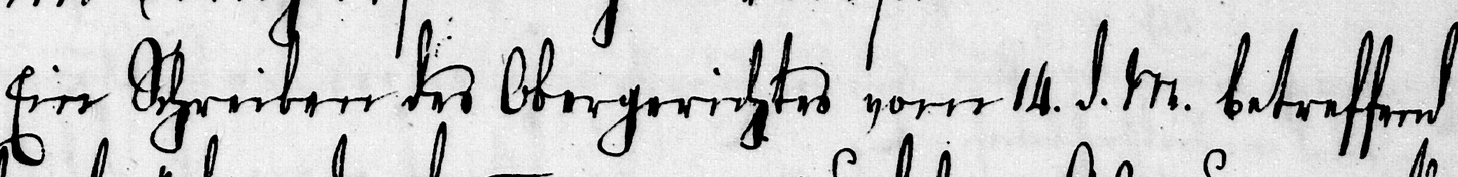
Ein Schreiben des Obergerichtes vom 14. d. M. betreffend
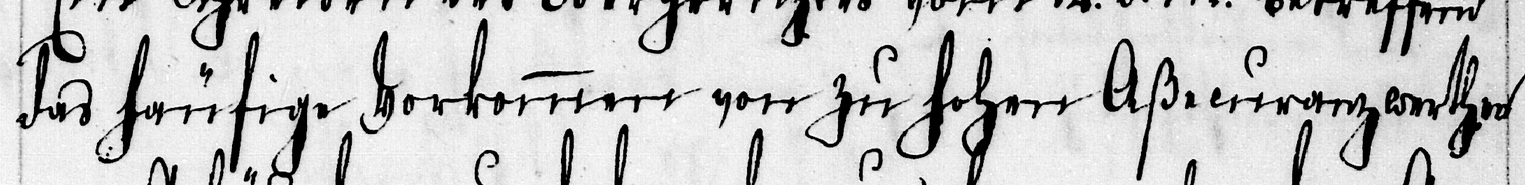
das häufige Vorkommen von zu hohen Aßecuranzwerthen
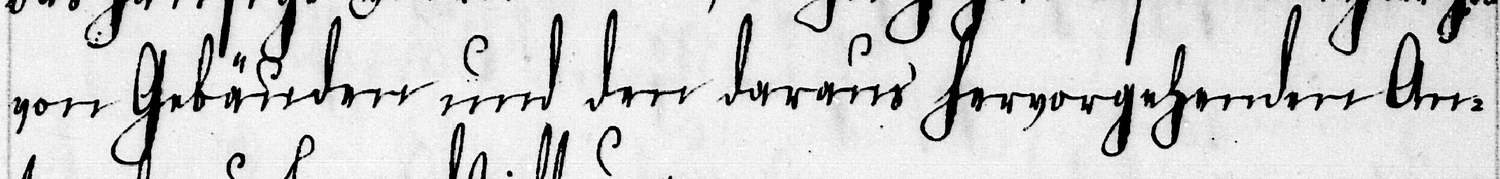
von Gebäuden und den daraus hervorgehenden An¬
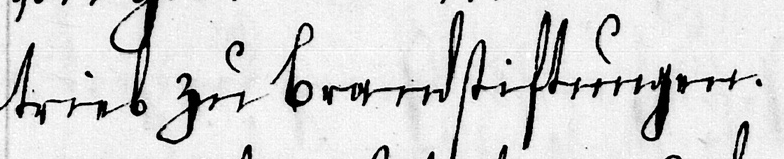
trieb zu Brandstiftungen.
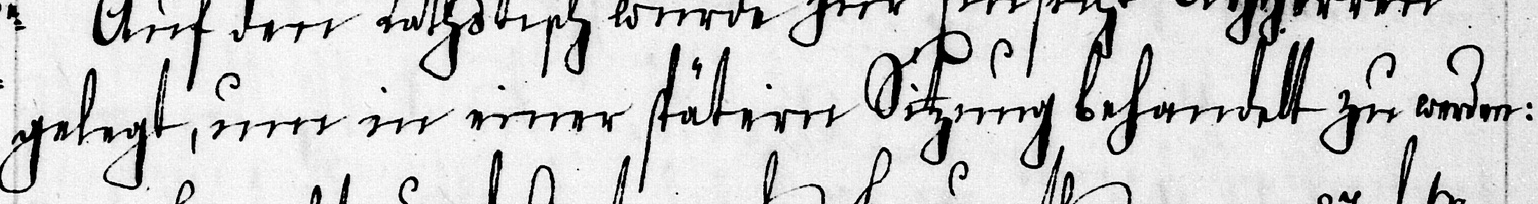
gelegt, um in einer spätern Sitzung behandelt zu werden:
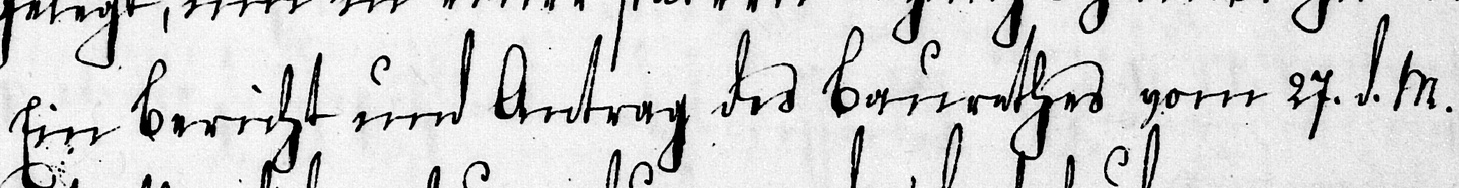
Ein Bericht und Antrag des Baurathes vom 27. d. M.
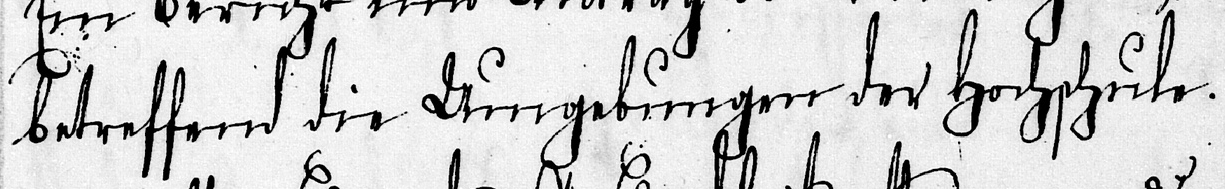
betreffend die Umgebungen der Hochschule.
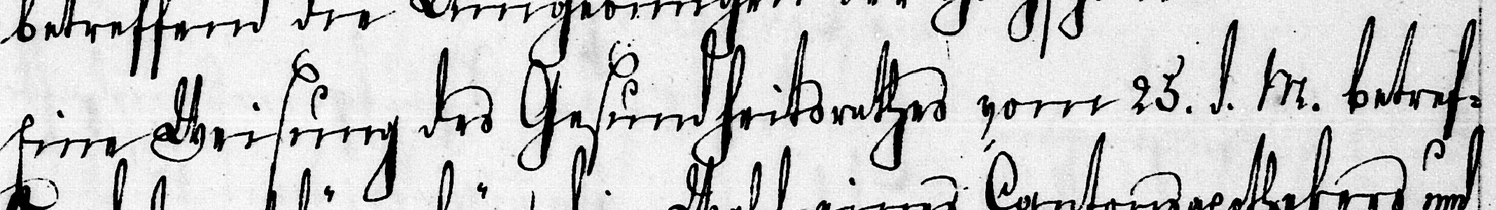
Eine Weisung des Gesundheitsrathes vom 25. d. M. betref¬
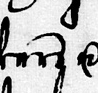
ref¬
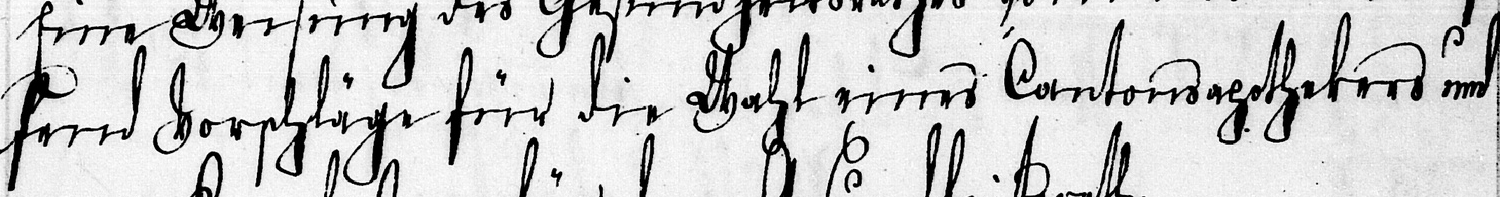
fend Vorschläge für die Wahl eines Cantonsapothekers und
